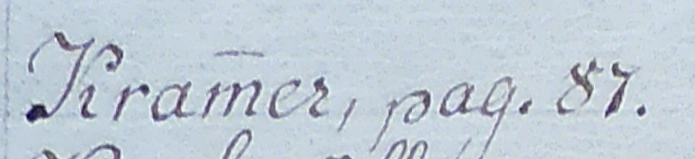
Kram̅er, pag. 87.
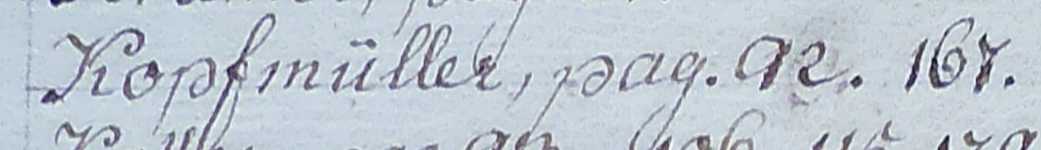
Kopfmüller, pag. 92. 167.
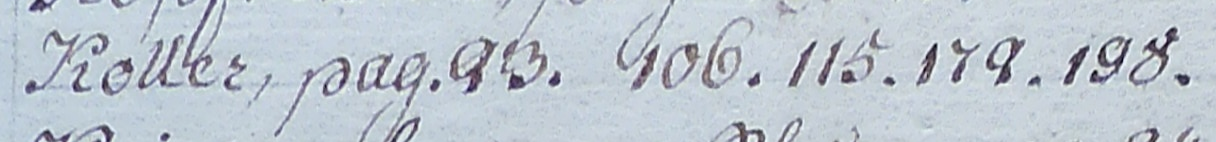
Koller, pag. 93. 106. 115. 179. 198.
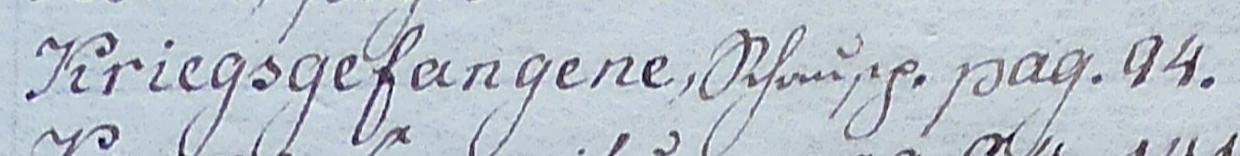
Kriegsgefangene, Schausp. pag. 94.
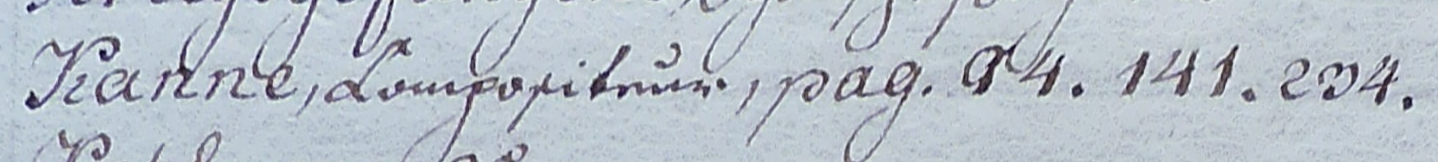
Kanne, Compositeur, pag. 94. 141. 234.
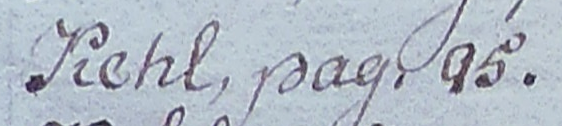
Kehl, pag. 95.
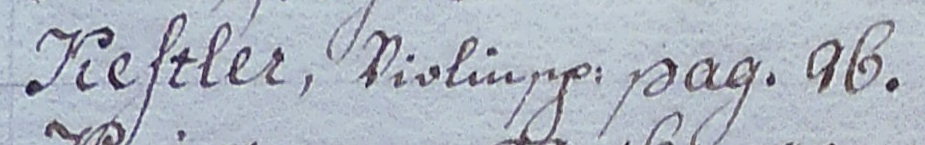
Kestler, Violinsp: pag. 96.
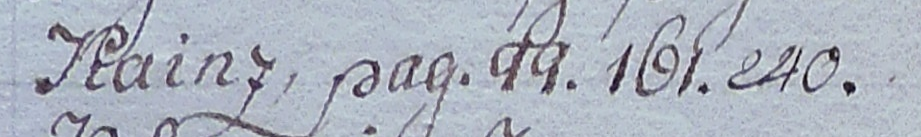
Kainz, pag. 99. 161. 240.
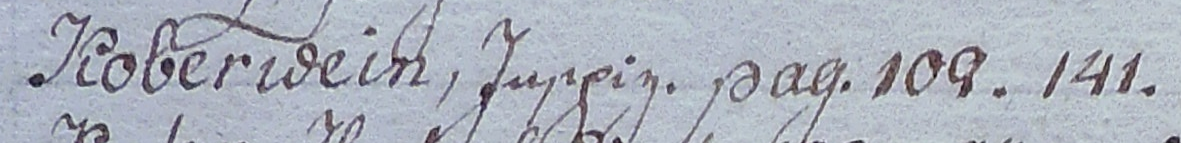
Koberwein, Inspiz. pag. 109. 141.
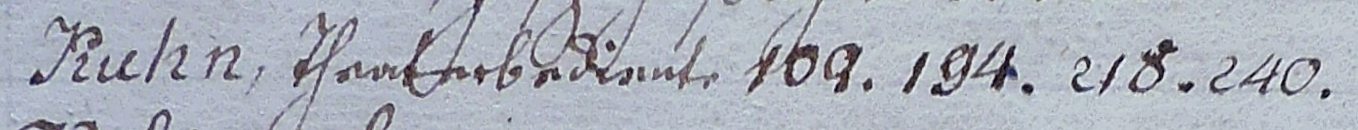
Kuhn, Theaterbedient. 109. 194. 218. 240.
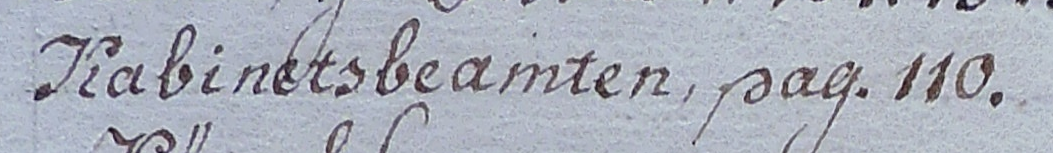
Kabinetsbeamten, pag. 110.
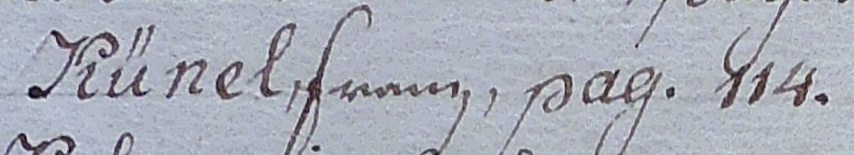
Künel, Franz, pag. 114.
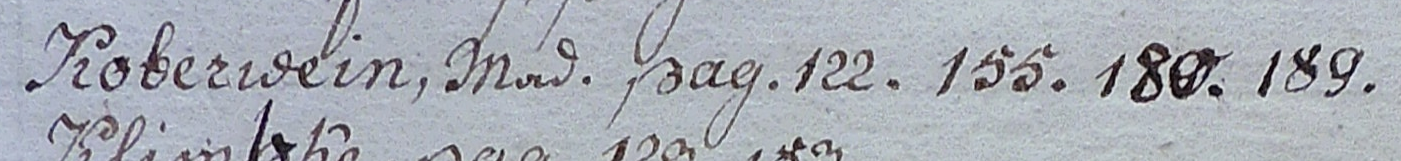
Koberwein, Mad. pag. 122. 155. 180. 189.
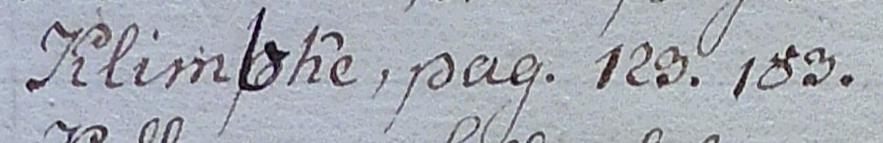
Klimbke, pag. 123. 183.
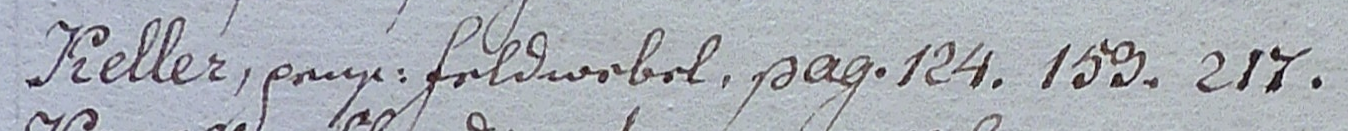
Keller, pens: Feldwebel, pag. 124. 153. 217.
